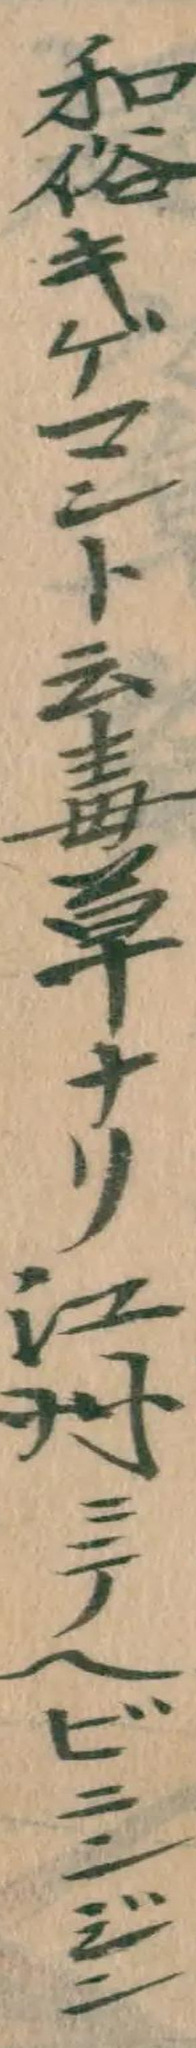和俗キゲマント云毒草ナリ江州ニテヘビニンジン
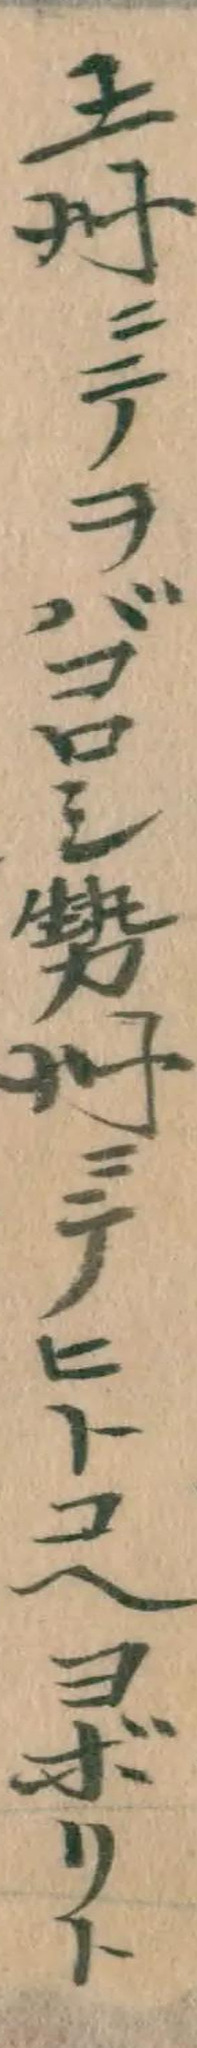土州ニテヲバコロシ勢州ニテヒトコヘヨボリト
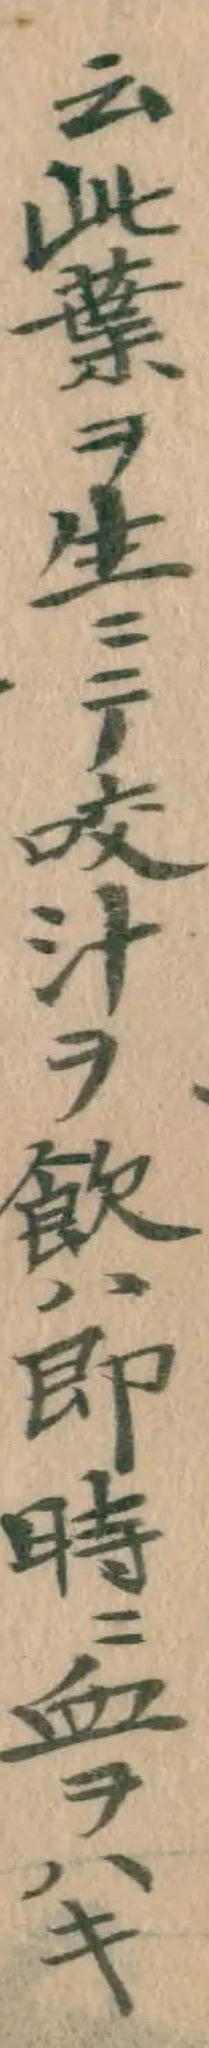云此葉ヲ生ニテ咬汁ヲ飲ハ即時ニ地血ヲハキ
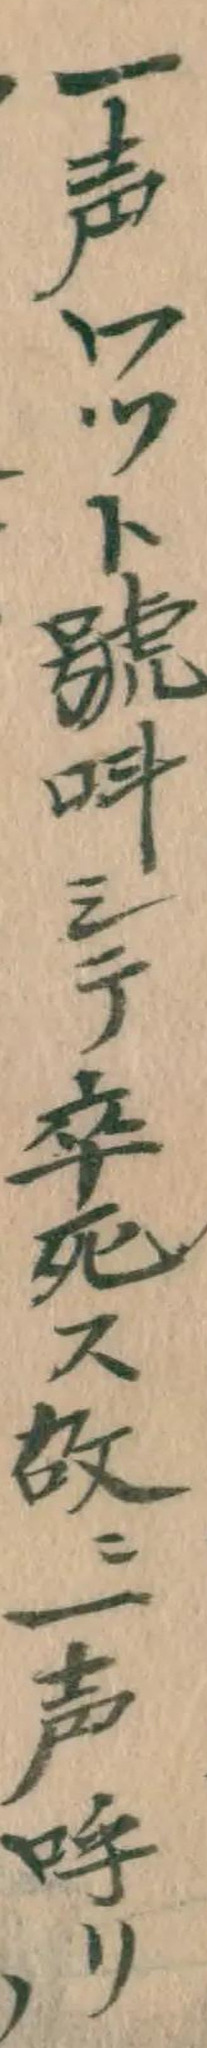一声ワツト號呌シテ卒死ス故ニ一声呼リノ
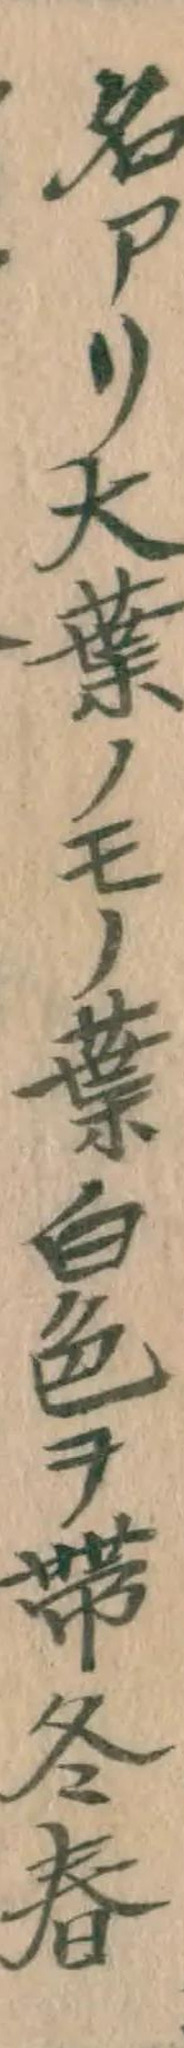名アリ大葉ノモノ葉白色ヲ帶冬春
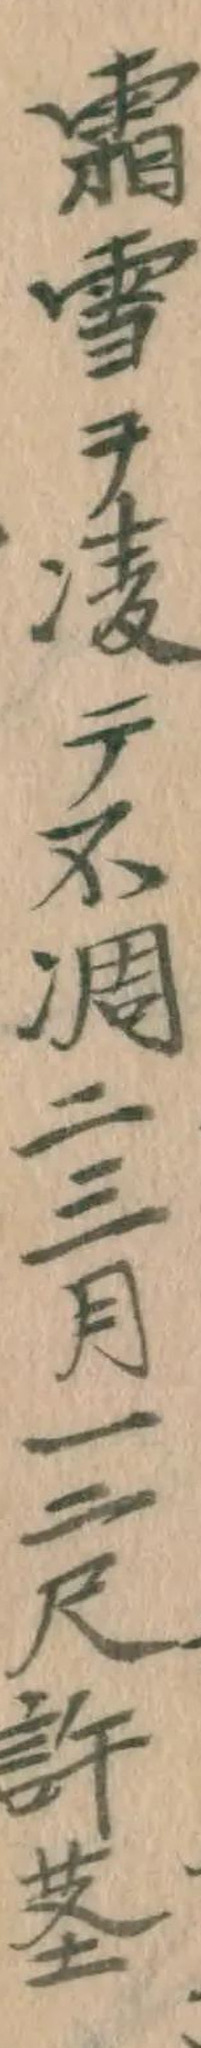霜雪ヲ凌テ不凋二三月一二尺許茎
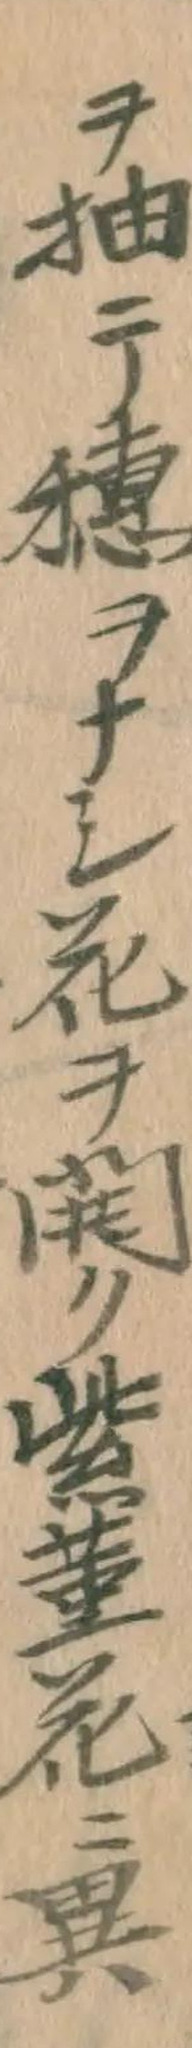ヲ抽テ穂ヲナシ花ヲ開く紫菫花ニ異
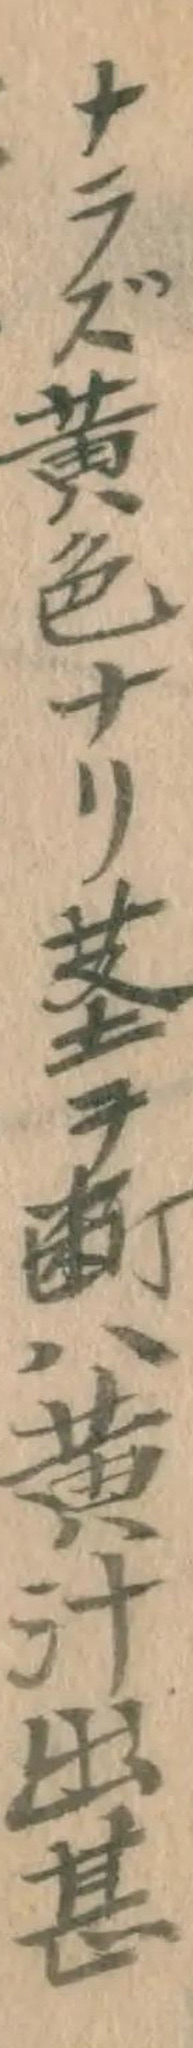ナラズ黄色ナリ茎ヲ断ハ黄汁出甚
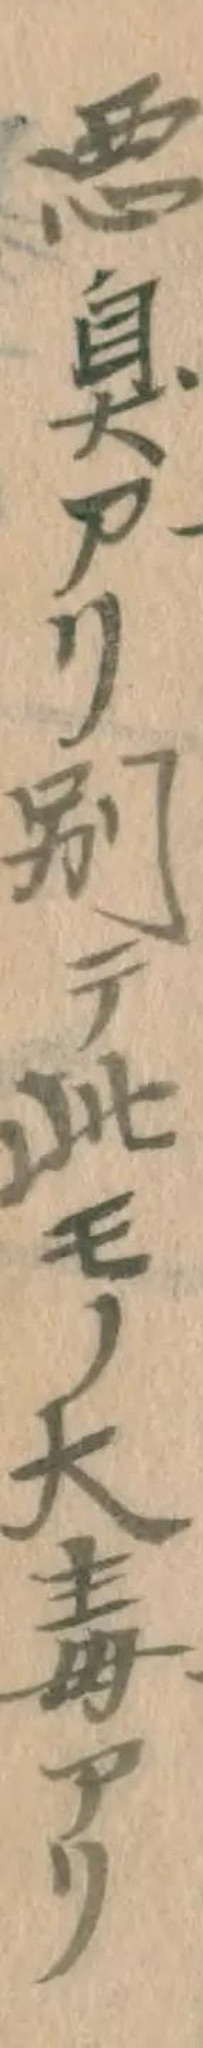悪臭アリ別テ此モノ大毒アリ
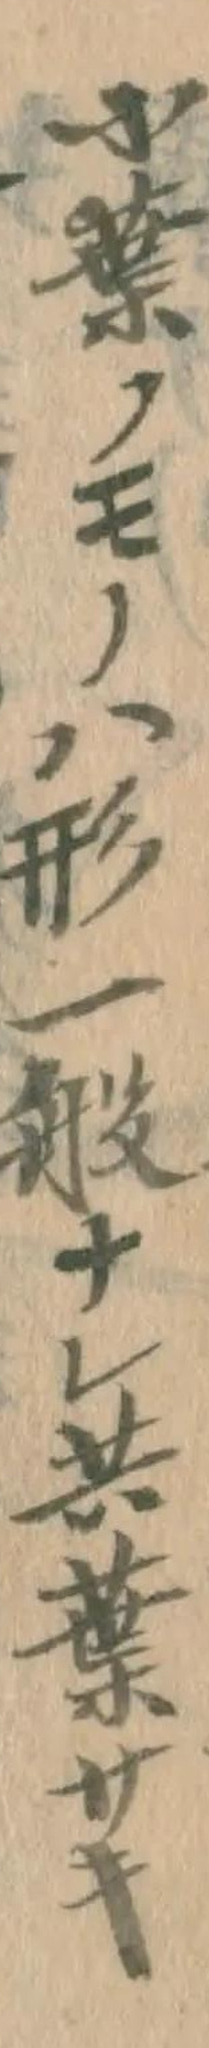小葉ノモノハ形一般ナレ共葉サキ
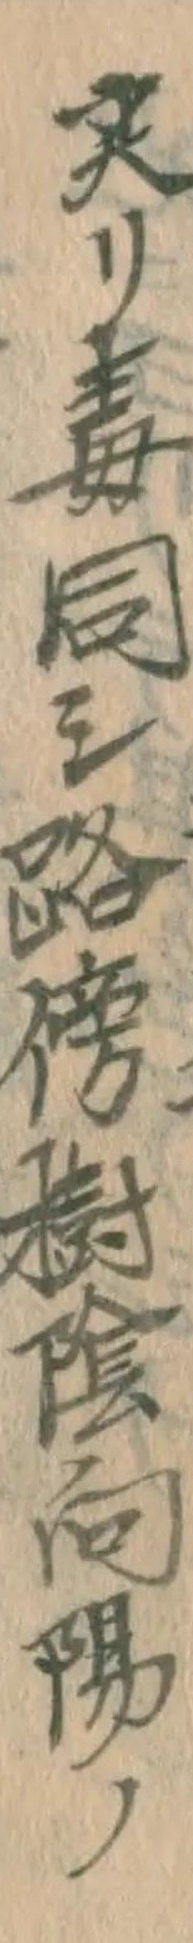突リ毒同シ路傍樹陰向陽ノ
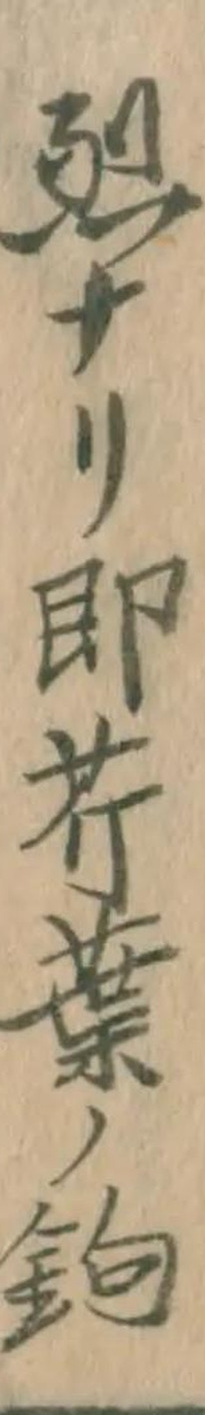烈ナリ即芹葉ノ鉤
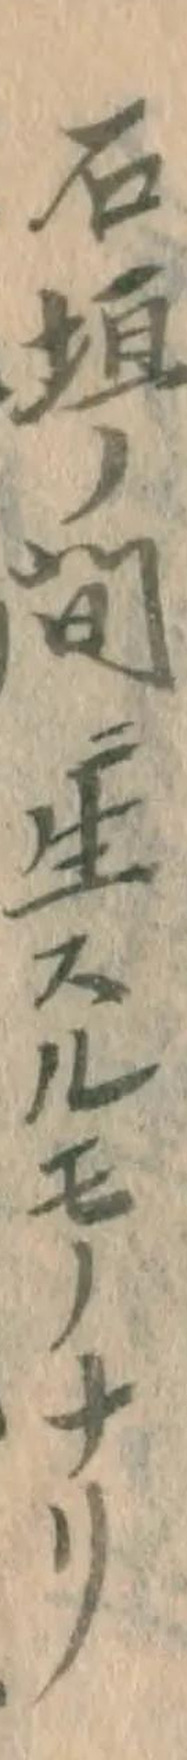石垣ノ間ニ生スルモノナリ
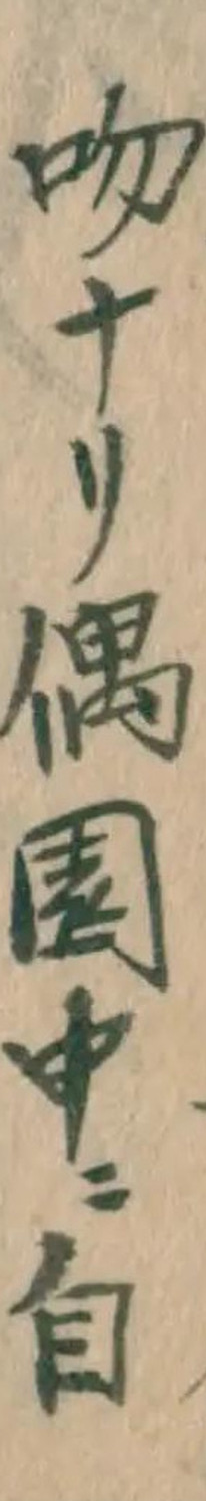吻ナリ偶園中ニ自
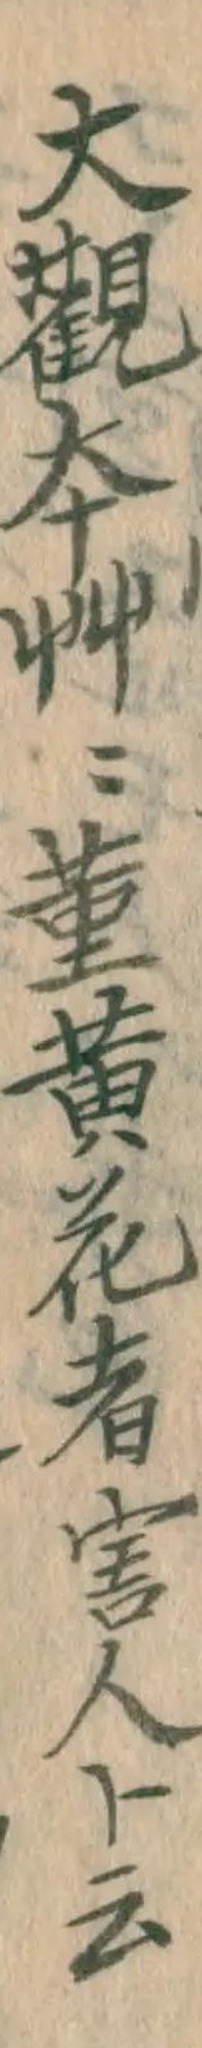大觀本艸ニ菫黄花者害人ト云
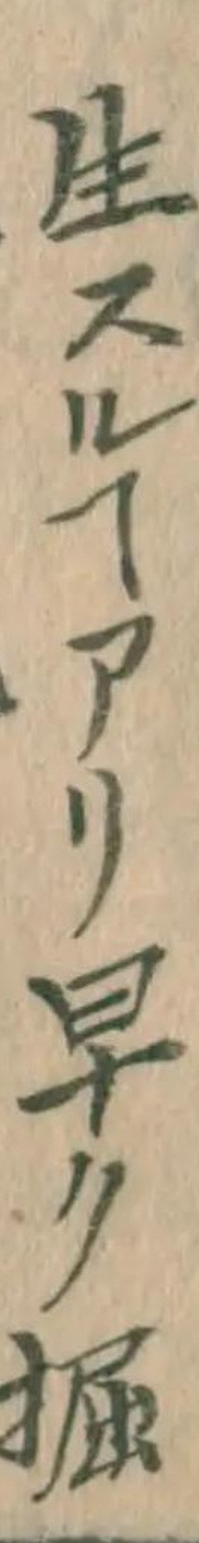生スルコトアリ早ク掘
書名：千蟲譜 3巻. [1]
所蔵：国立国会図書館 National Diet Library, JAPAN
